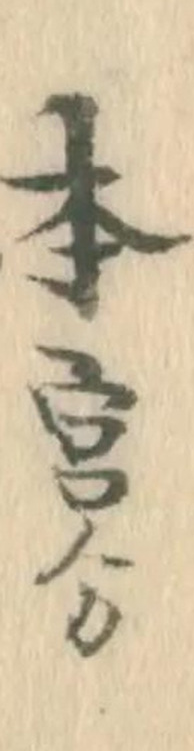本宮分
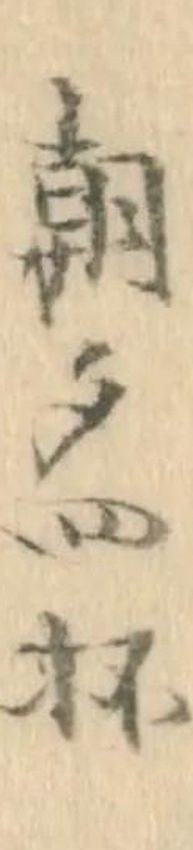朝夕四杯
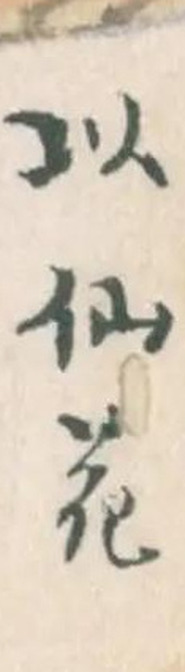以仙花
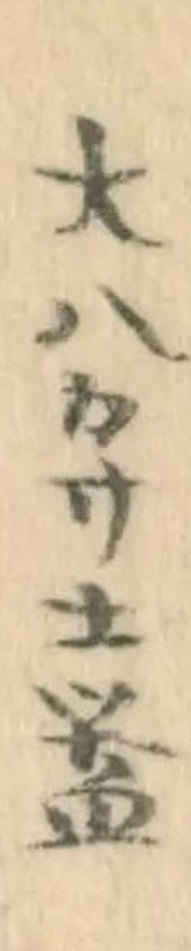大ハカサ土器
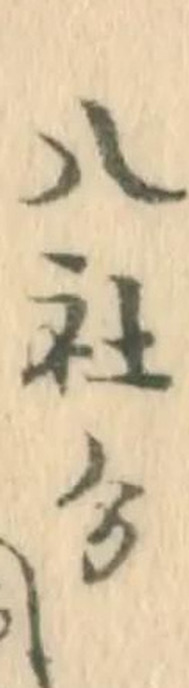八社分
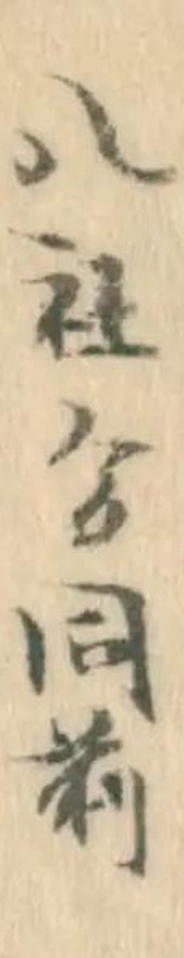八社分同前
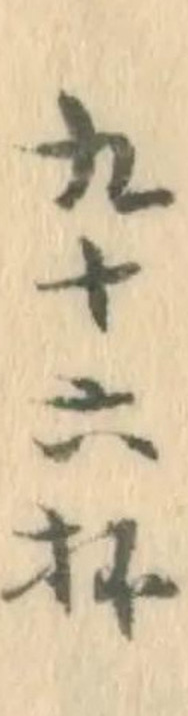九十六杯
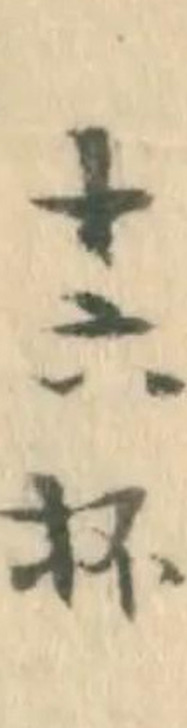十六杯
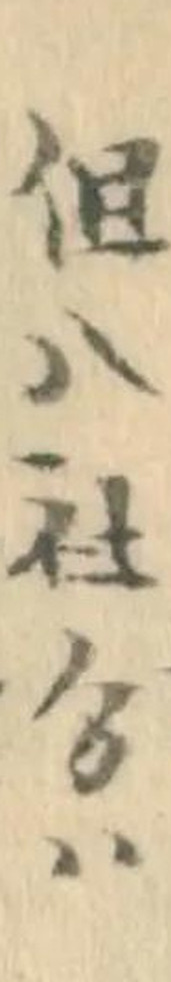但八社分ハ
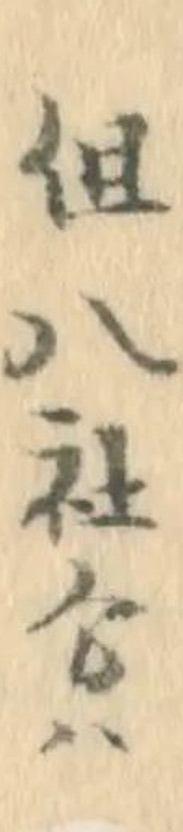但八社分ハ
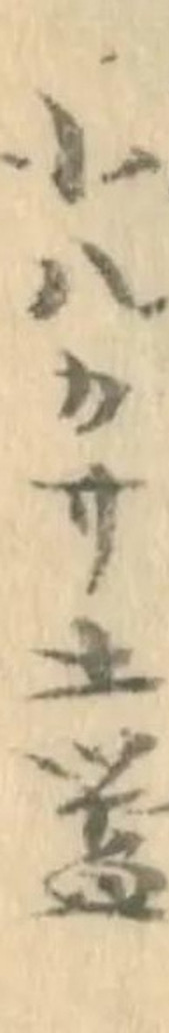小ハカサ土器
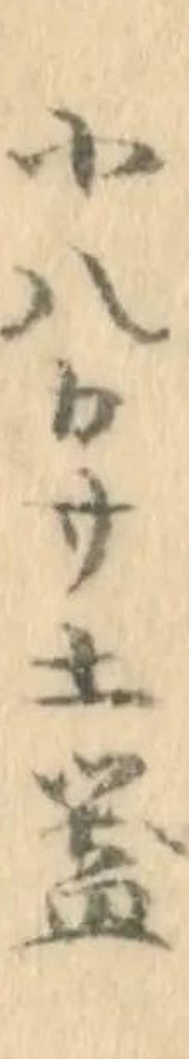小ハカサ土器

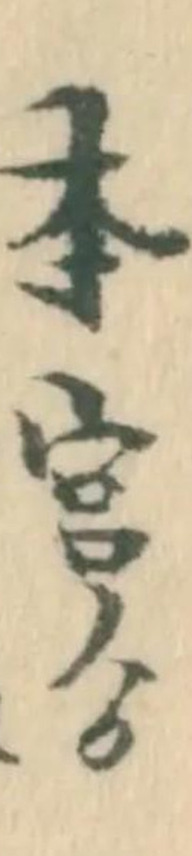本宮分
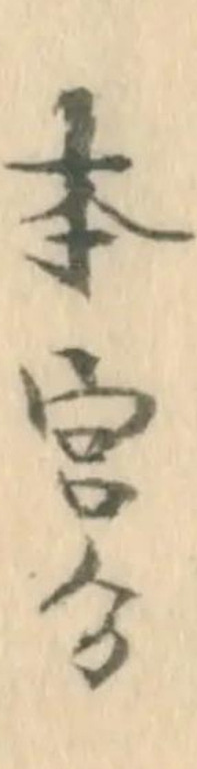本宮分
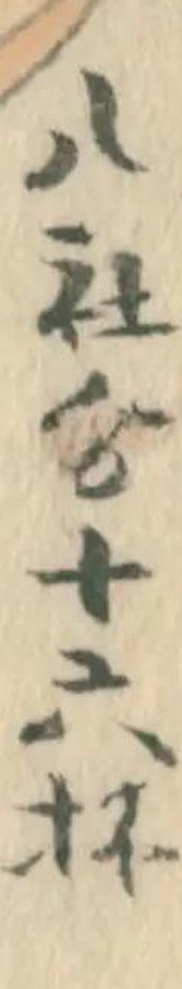八社分十六杯
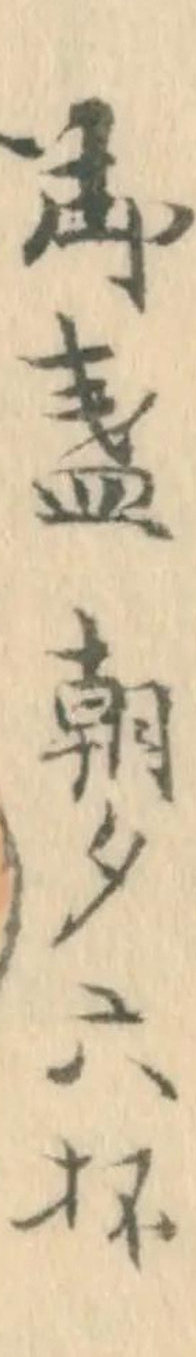御盞朝夕六杯
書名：葵御祭供進之神饌諸品色目書
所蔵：国立国会図書館 National Diet Library, JAPAN
